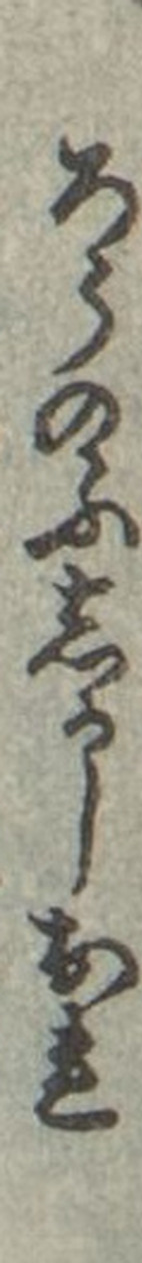ろうのふしかしおれ
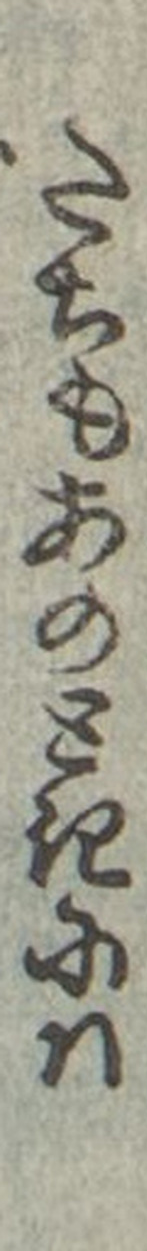たちもあのときには
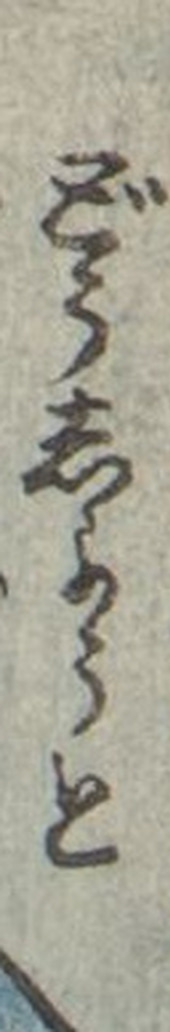どうしようと
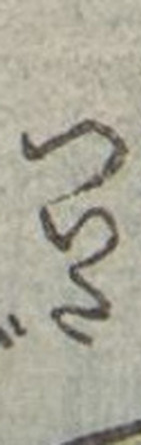ついた
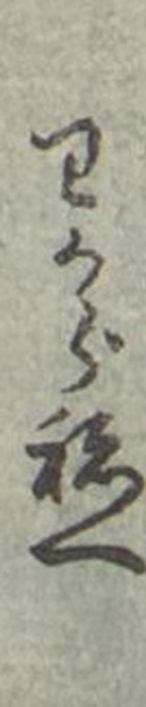わからねへ
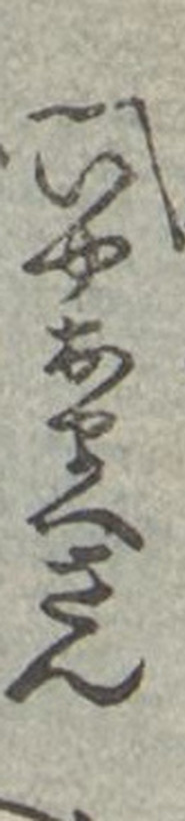〽いやおまへさん
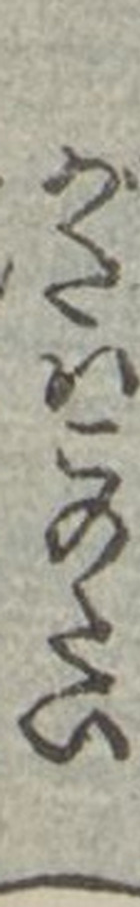がたはこのたい
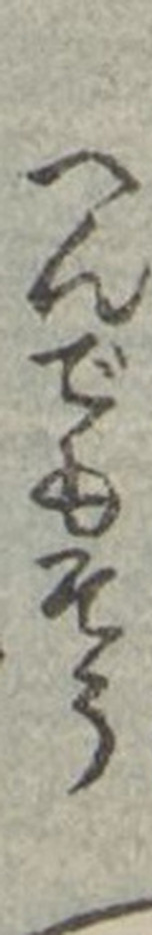へんでもそう
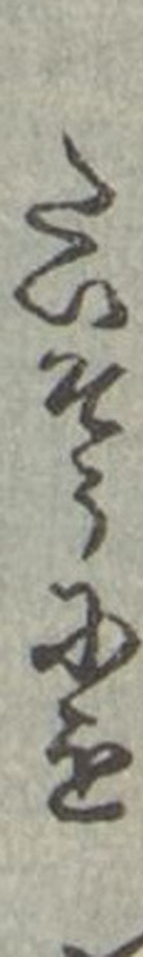たいそうにを
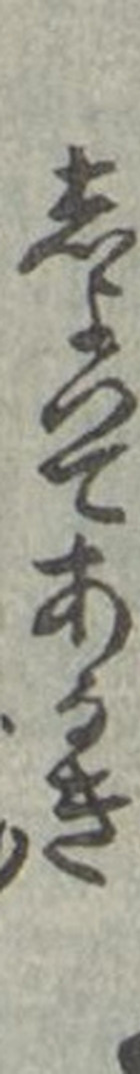しよつてあるき
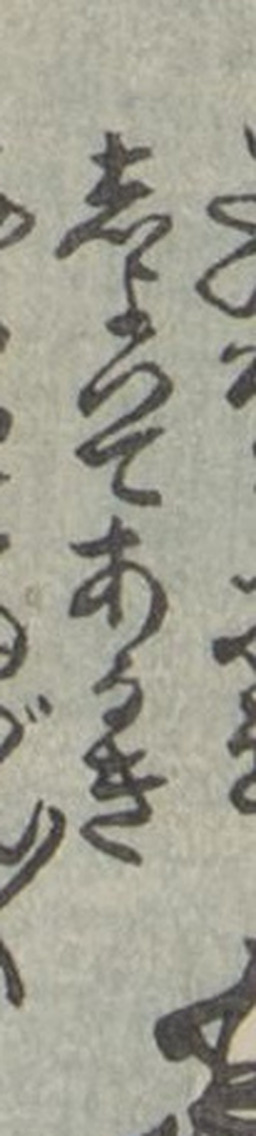しよつてあるき
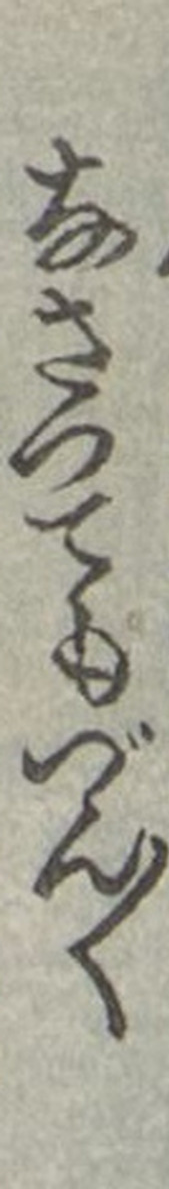なさつてもづん〳〵
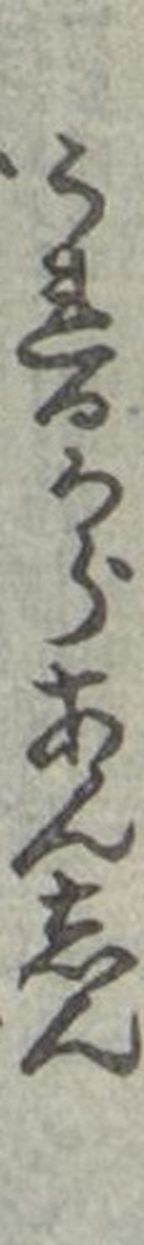うれるからあんしん
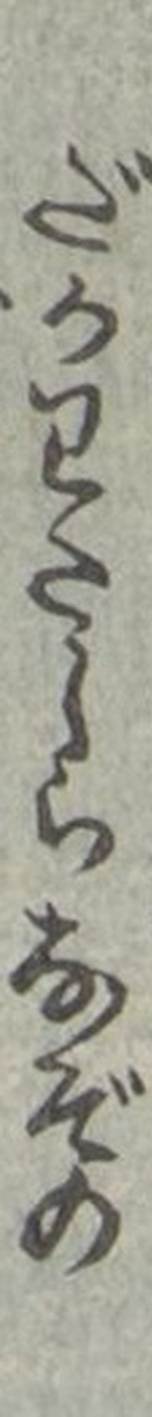だかわたしらなぞの
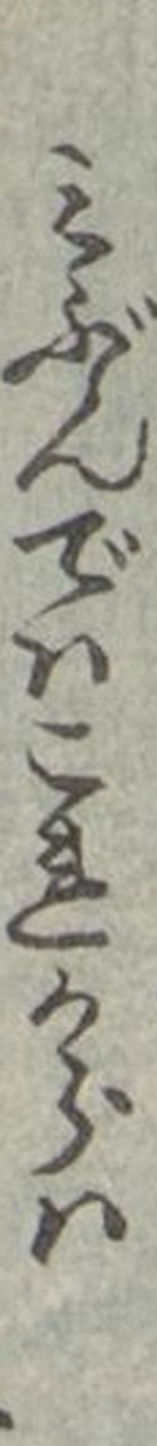みぶんではこれからは
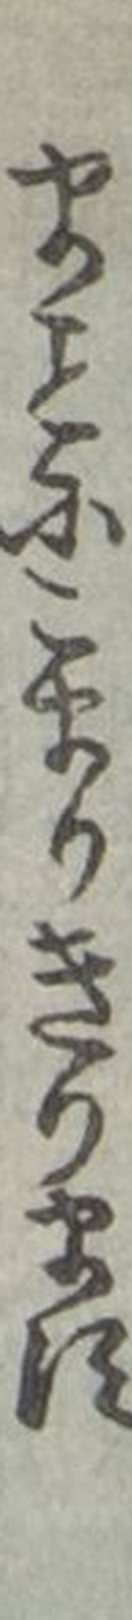まことにこまりきります
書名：ほね抜どぞう／なまづおなんぎ大家場焼
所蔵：あいおいニッセイ同和損保株式会社
